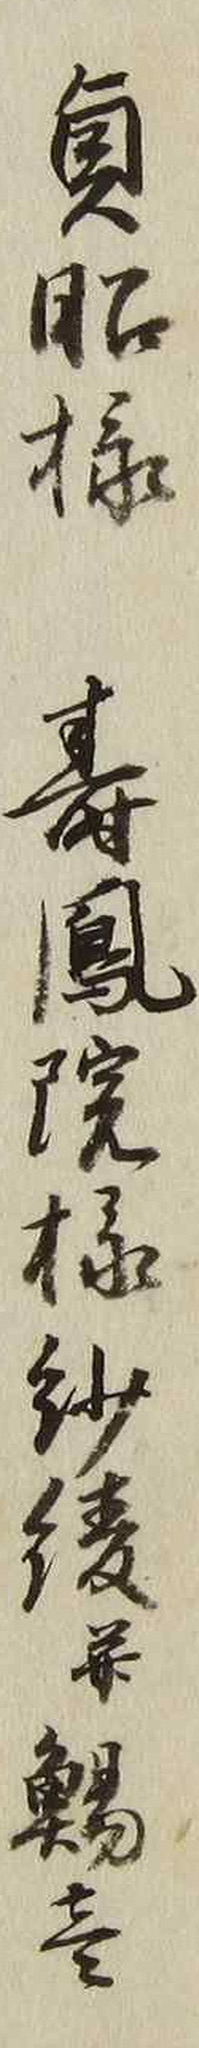貞昭様寿鳳院様沙綾并鯣壱
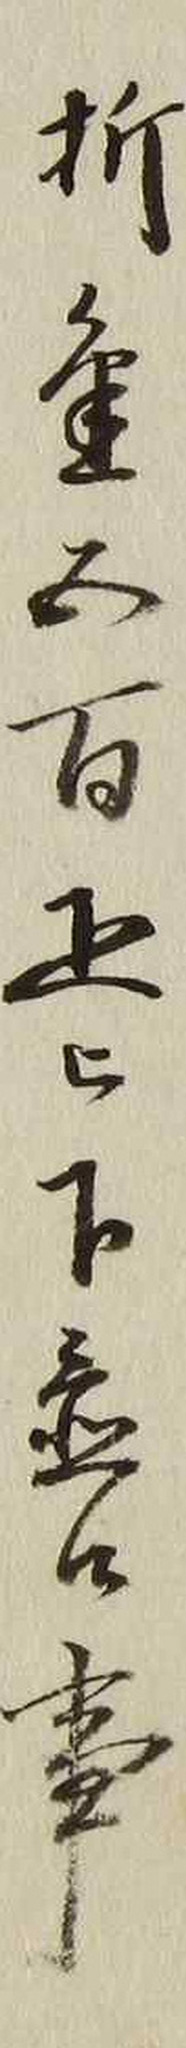折金五百疋被下置候事
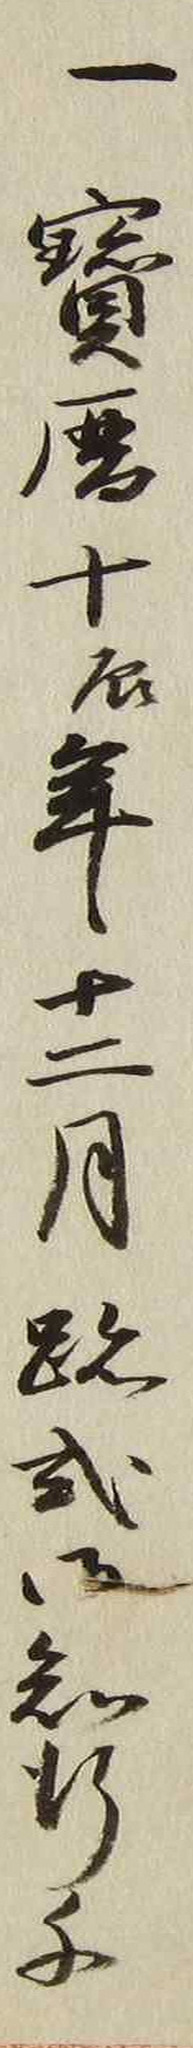一宝暦十辰年十二月跡式御知行千
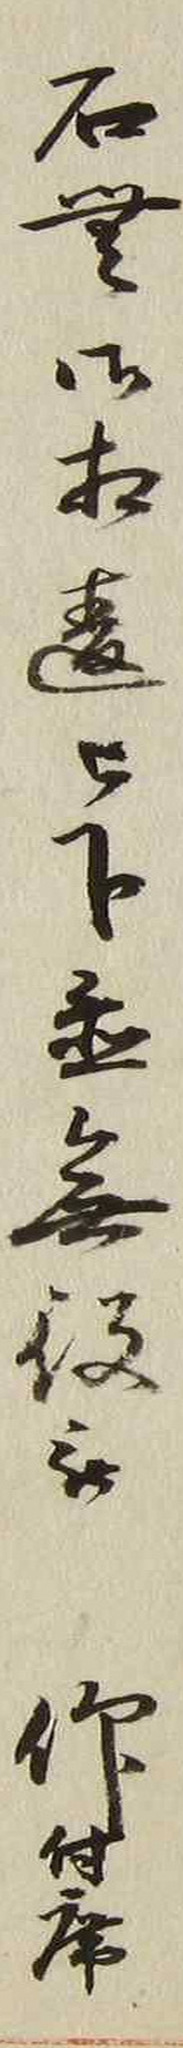石無御相違被下置無役被仰付席
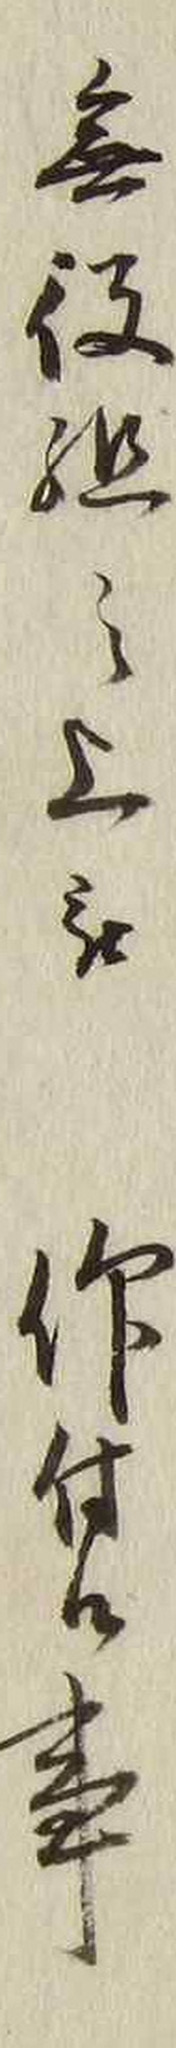無役組之上被仰付候事
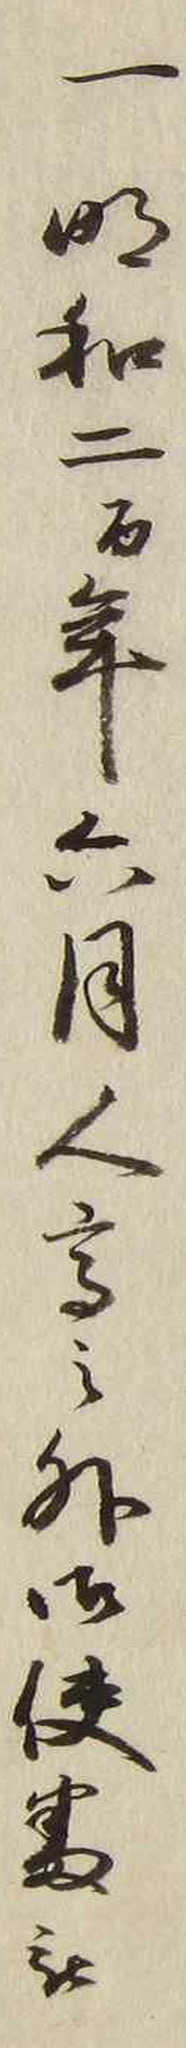一明和二酉年六月人高之外御使番被
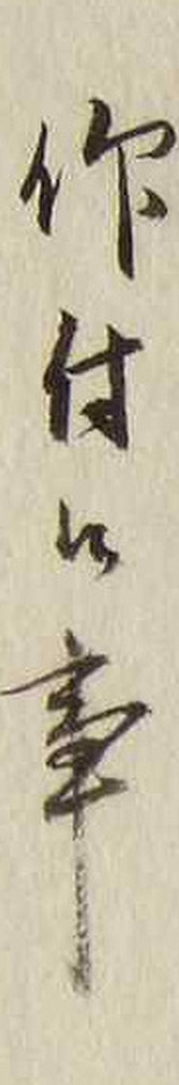仰付候事

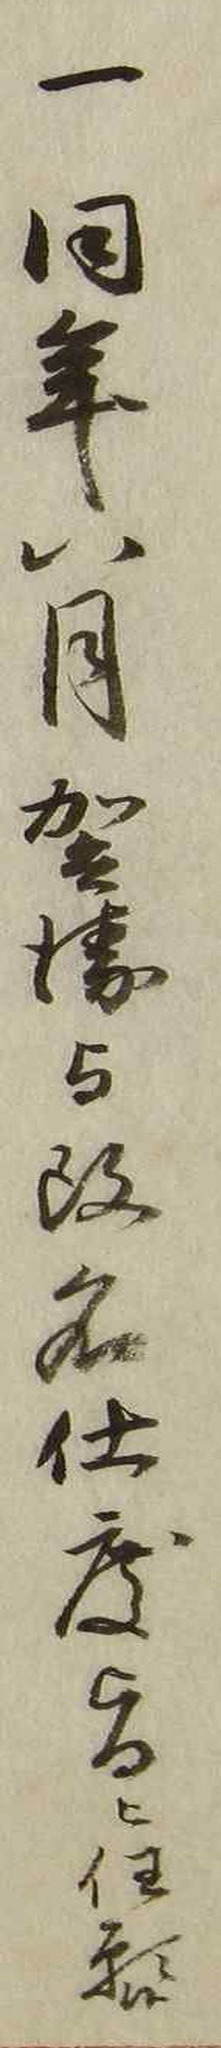一同年八月加兵衛と改名仕度旨被任願候
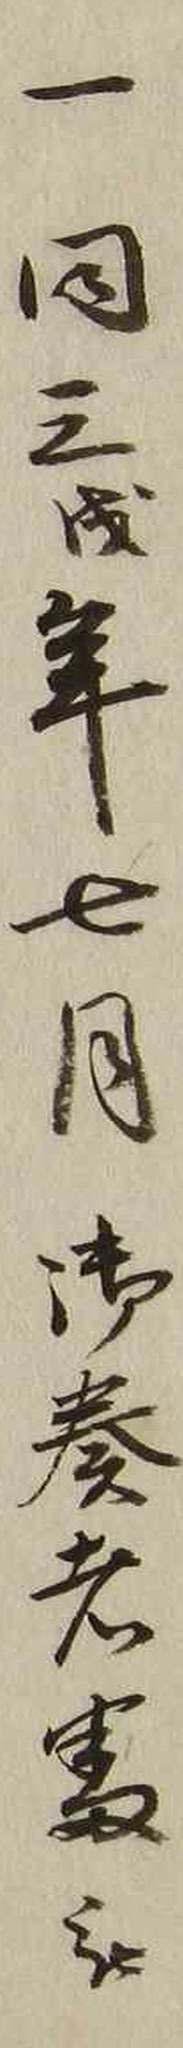一同三戌年七月御奏者番被
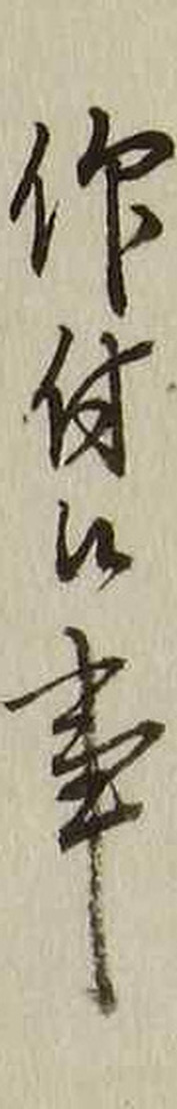仰付候事
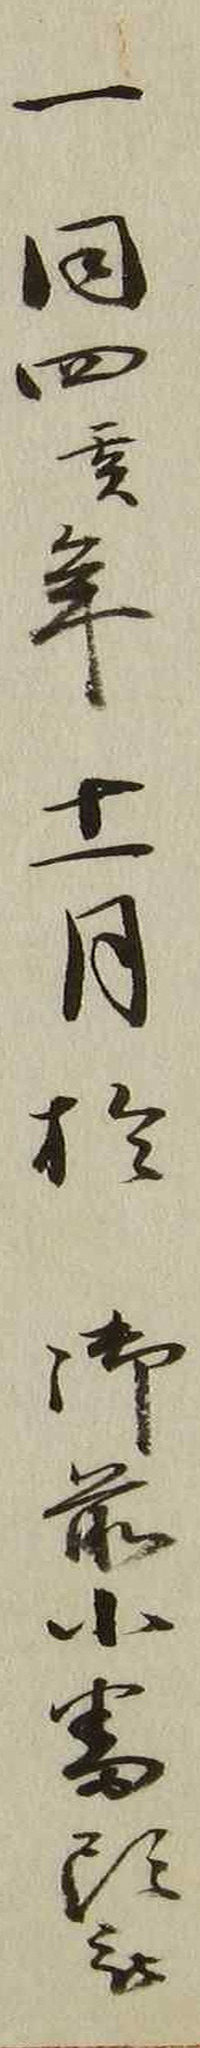一同四亥年十一月於御前小番頭被
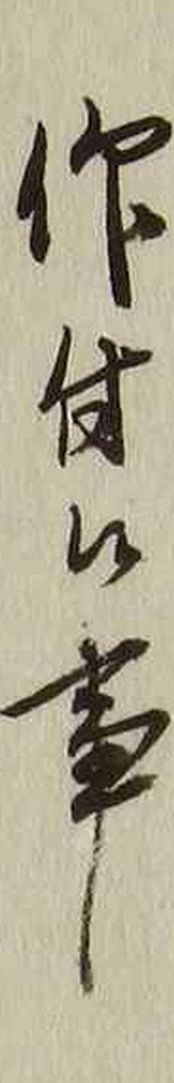仰付候事
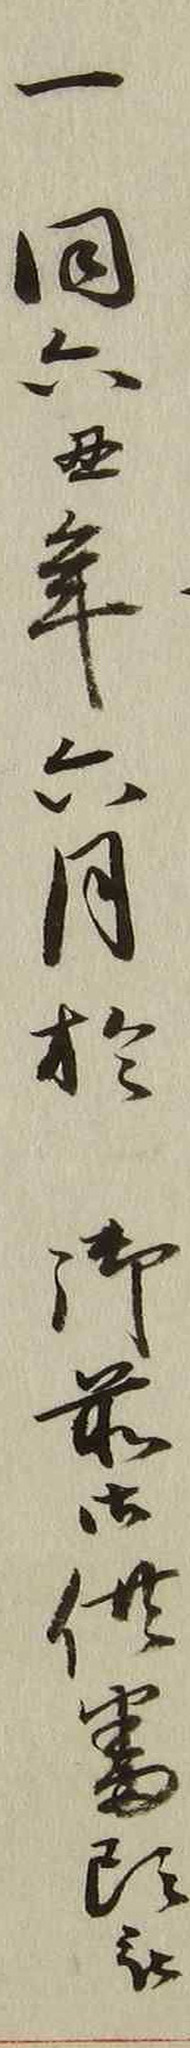一同六丑年六月於御前御供番頭被
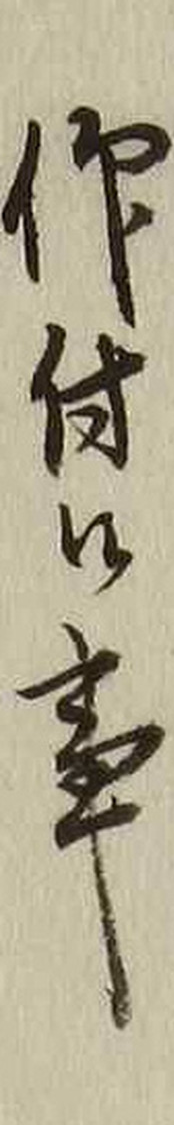仰付候事
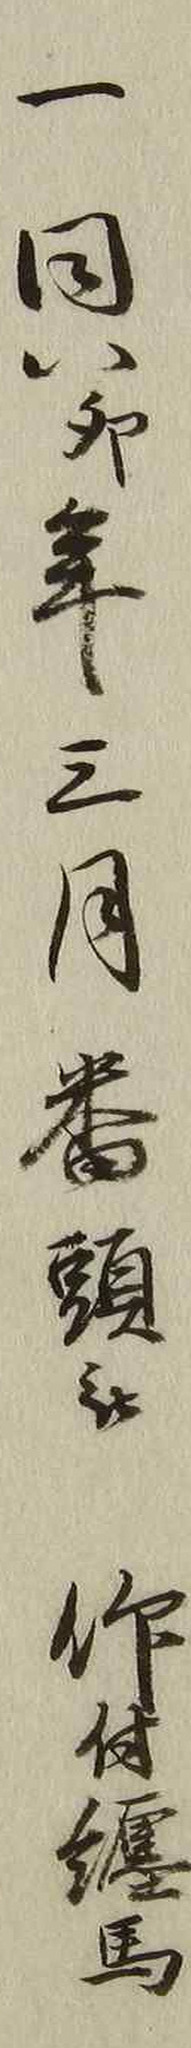一同八卯年三月番頭被仰付纏馬
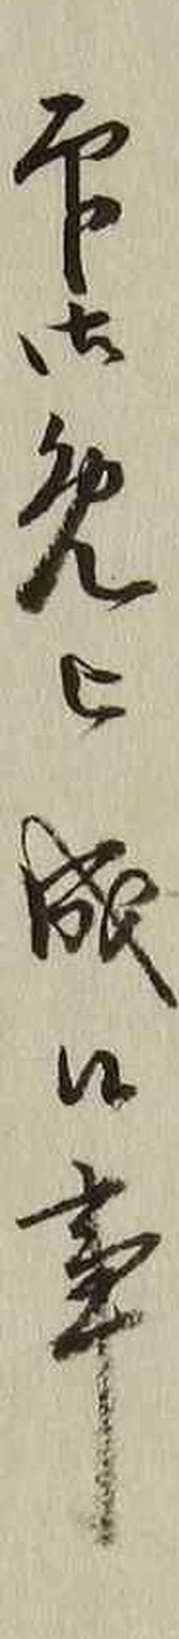印御免被成候事
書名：諸士系譜　巻之125　た之部1
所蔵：会津若松市立会津図書館
